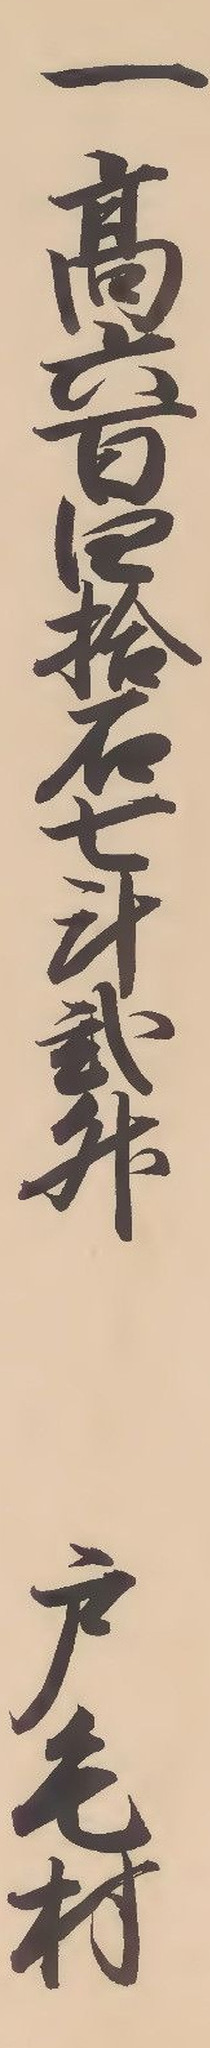一高六百四拾石七斗弐升戸毛村
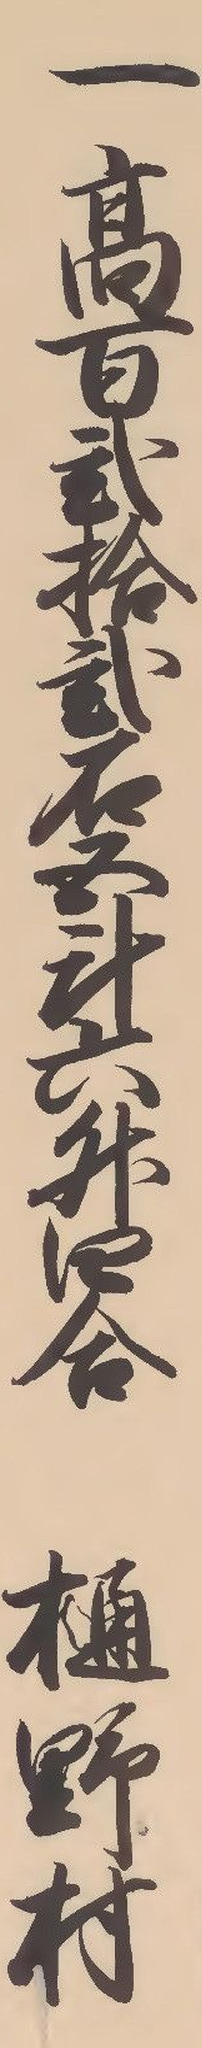一高百弐拾弐石五斗六升四合樋野村
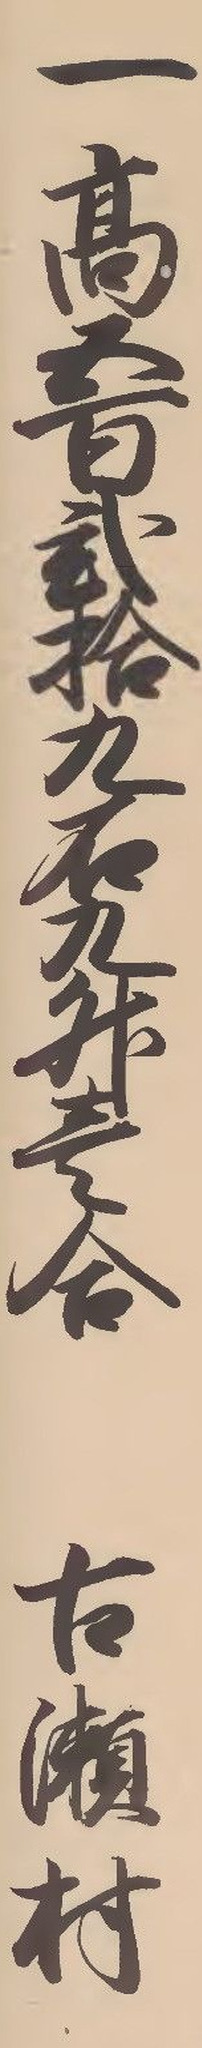一高五百弐拾九石九升壱合古瀬村
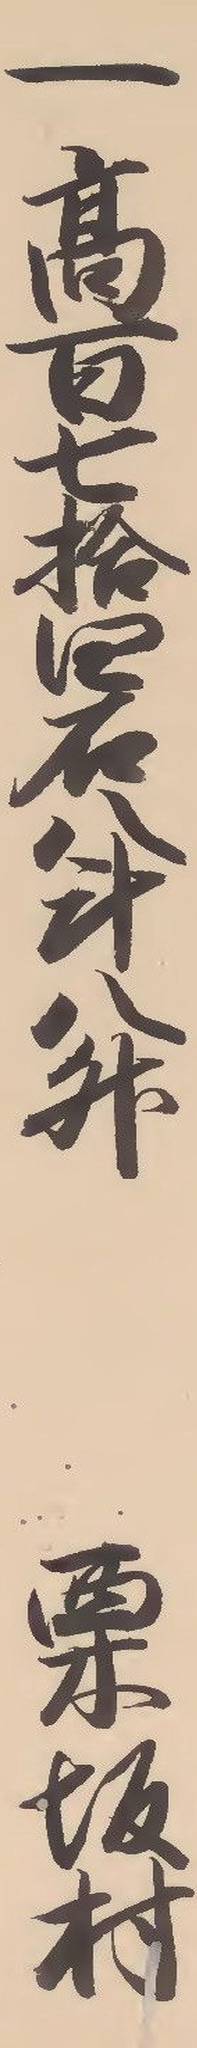一高百七拾四石八斗八升栗坂村
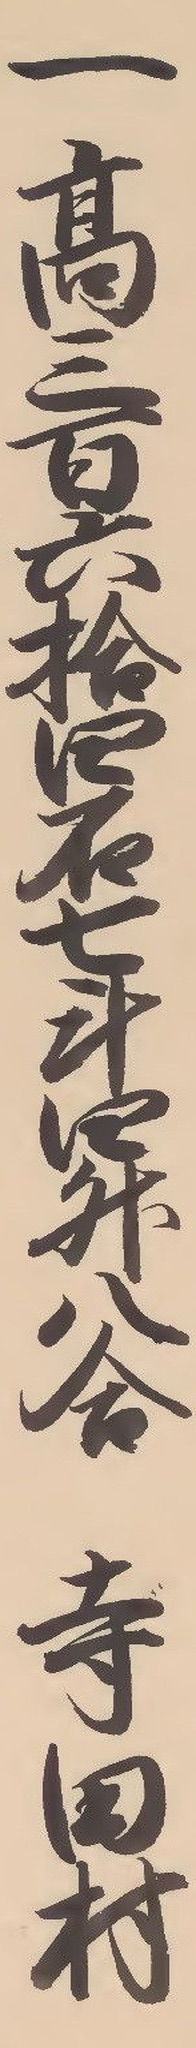一高三百六拾四石七斗四升八合寺田村
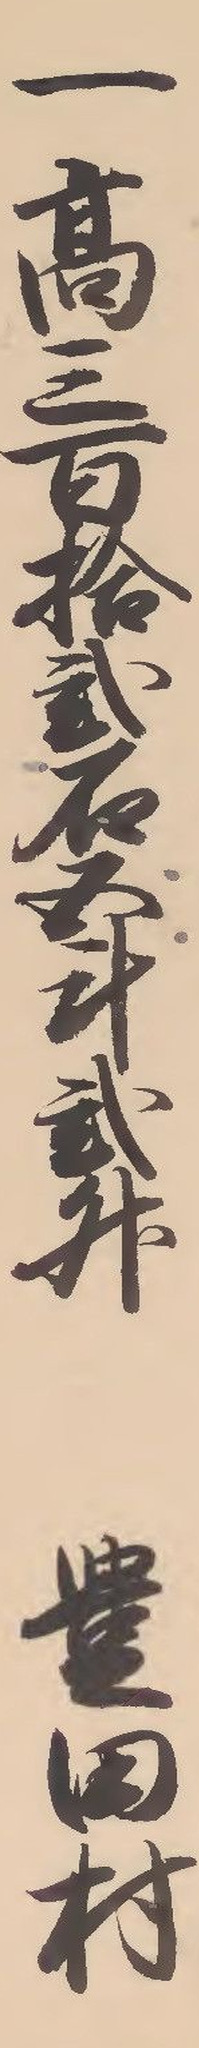一高三百拾弐石五斗弐升豊田村

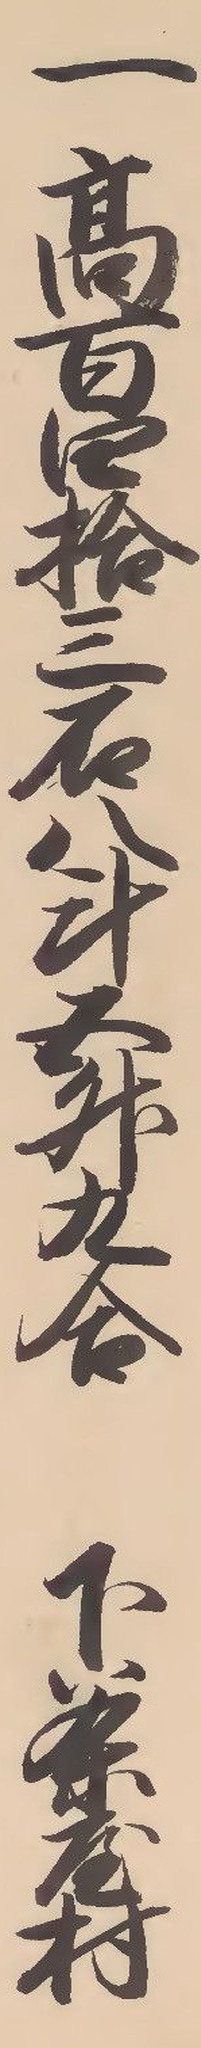一高百四拾三石八斗五升九合下茶屋村
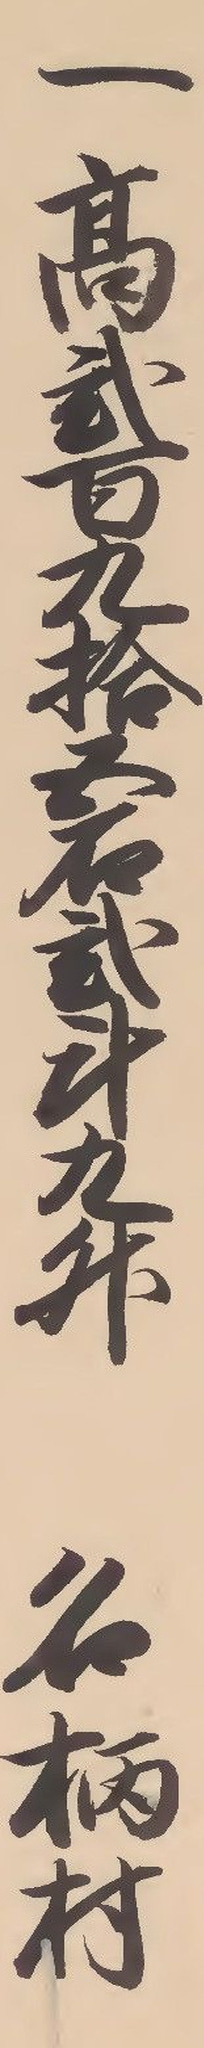一高弐百九拾五石弐斗九升名柄村
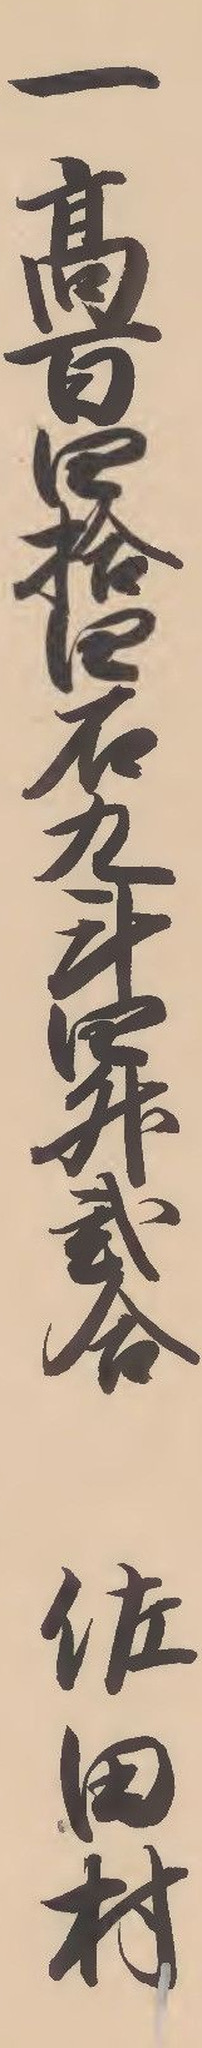一高百四拾四石九斗四升弐合佐田村
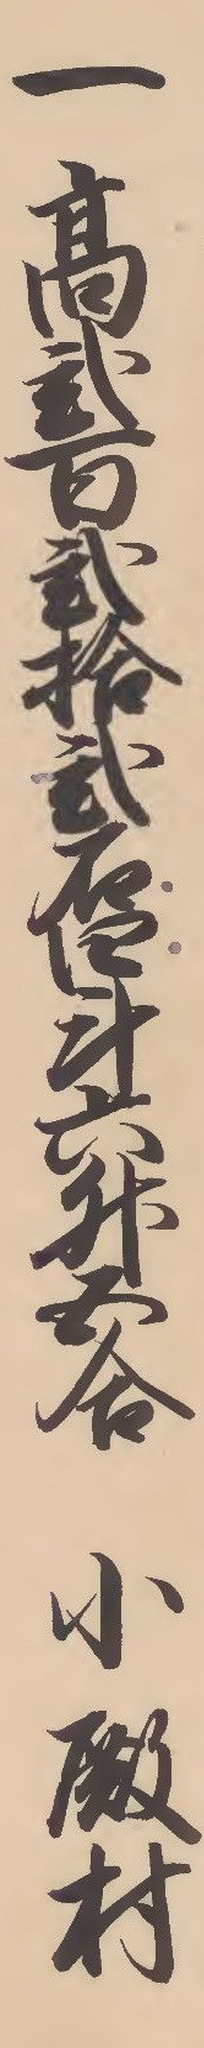一高弐百弐拾弐石四斗六升五合小殿村

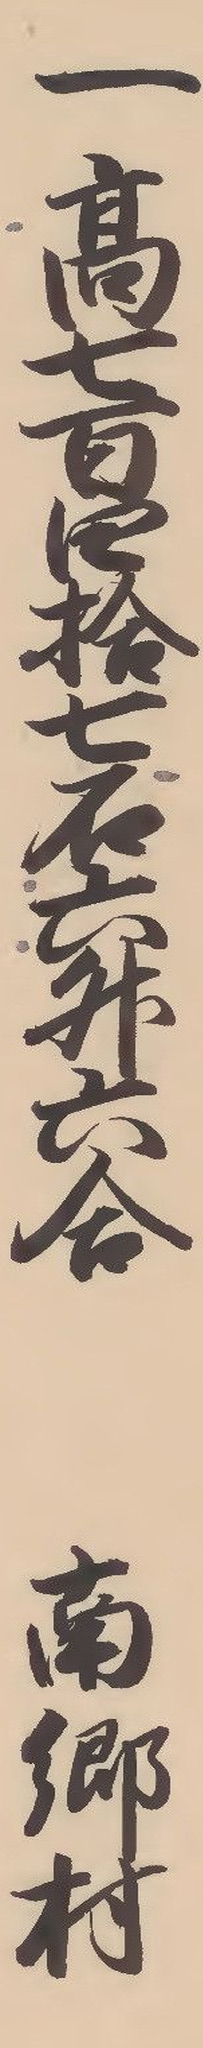一高七百四拾七石六升六合南郷村
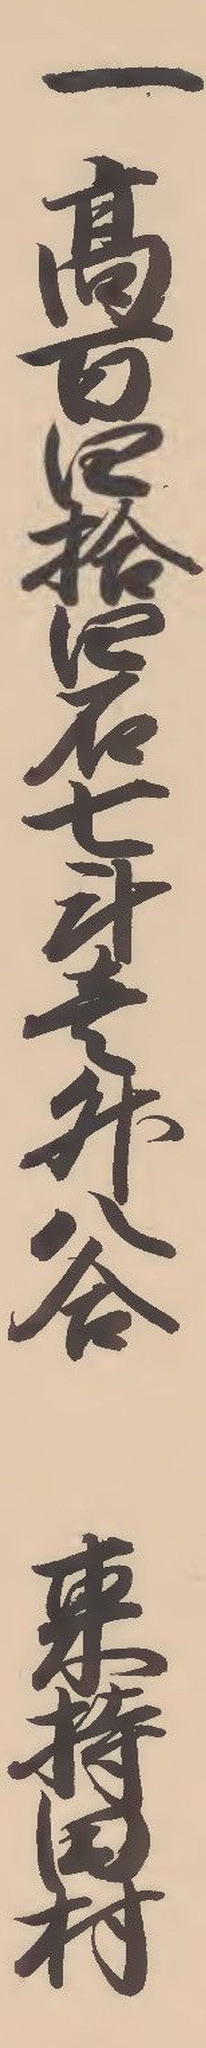一高百四拾四石七斗壱升八合東持田村
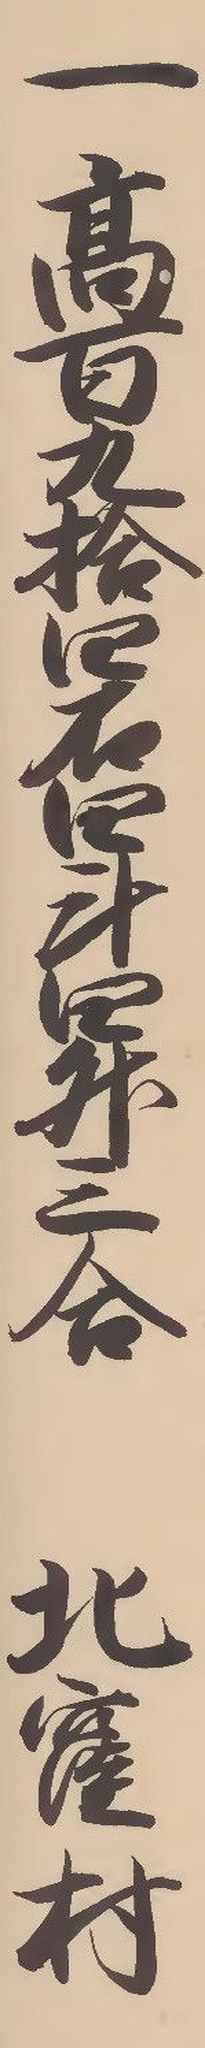一高百九拾四石四斗四升三合北窪村
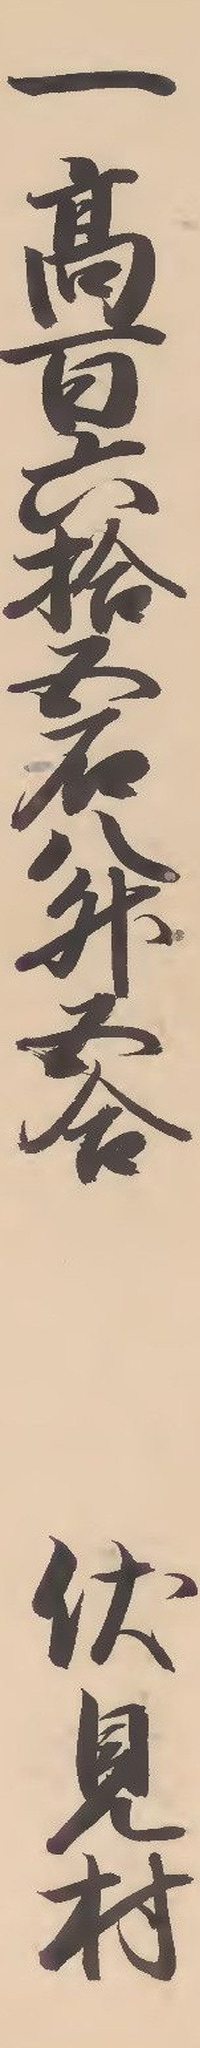一高百六拾五石八升五合伏見村

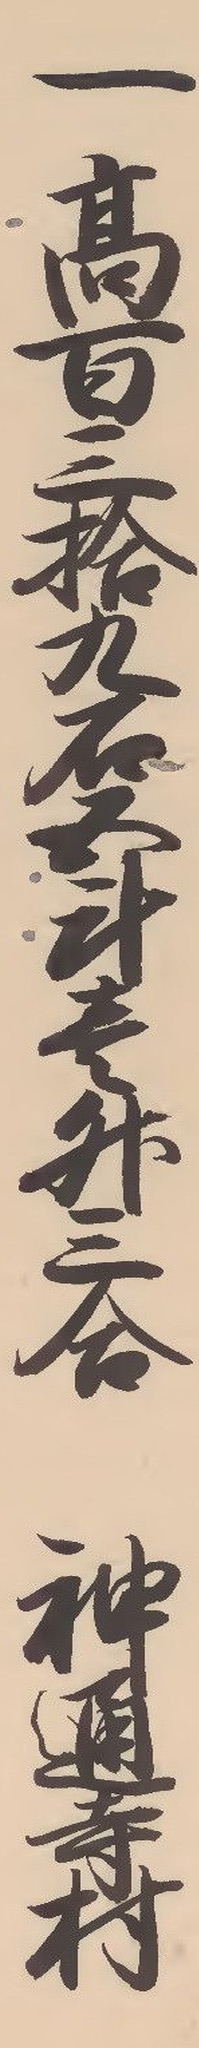一高百三拾九石五斗壱升三合神通寺村
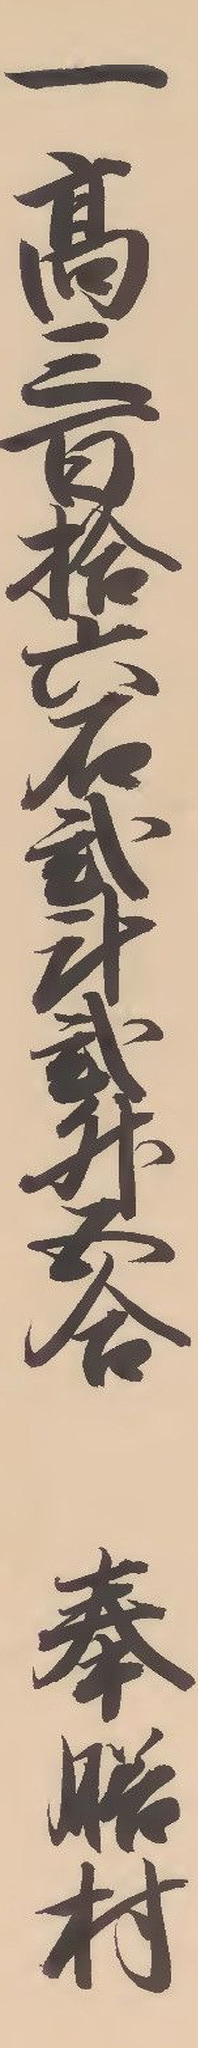一高三百拾六石弐斗弐升五合奉膳村
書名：大和国郷帳
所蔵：国立公文書館 National Archives of Japan
